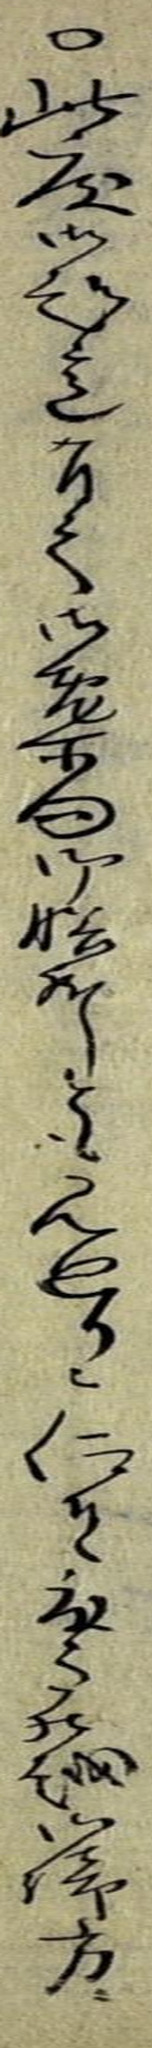○此度御趣意有之御台所向御膳所とも見廻り被仰付候度々罷越御締方に
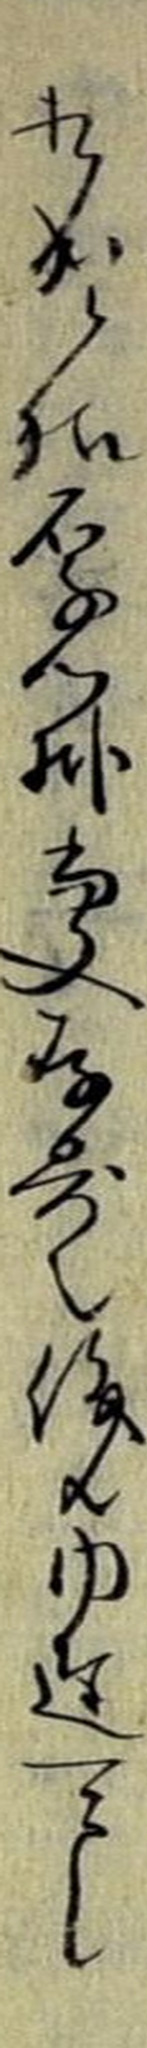相成候様厚心掛尚又存寄之儀共内達可申候
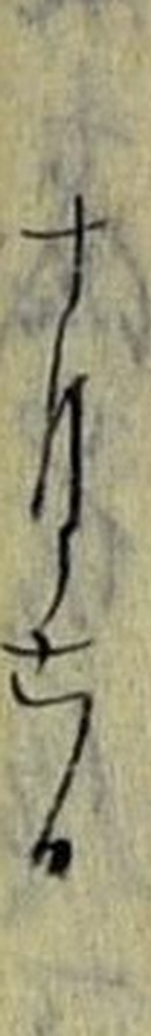十月六日
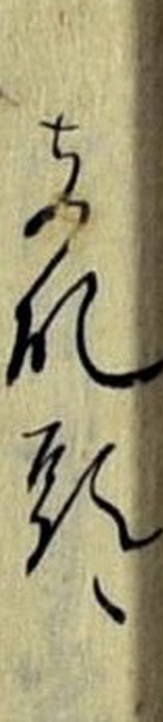支配頭へ
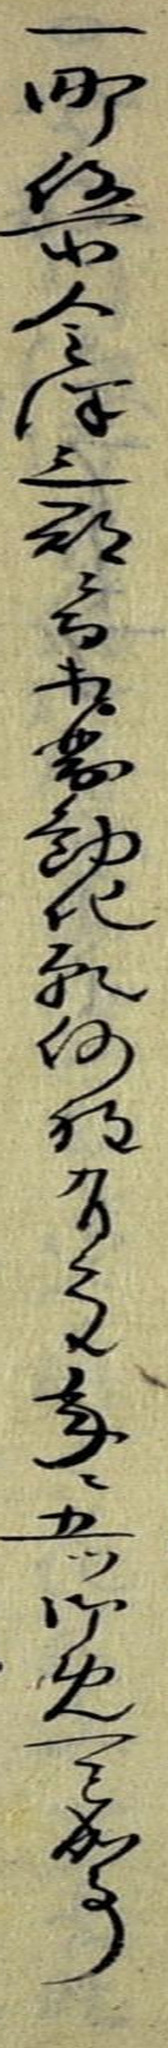一町役所金津三郡に而相対勧化願何程有之共年に五つ御免可被成事
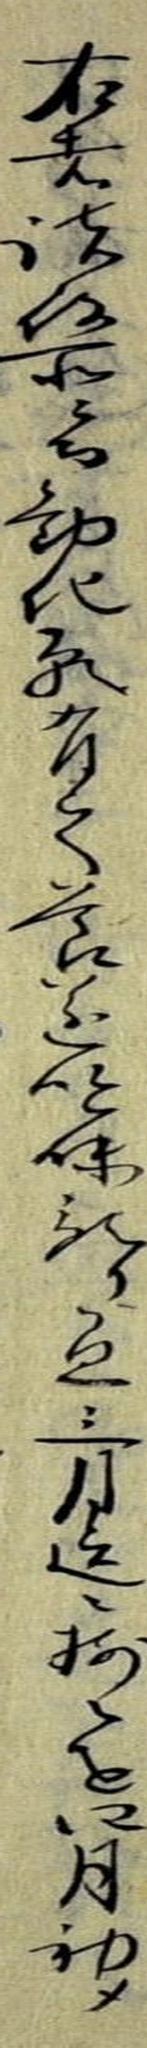右は諸役所に而勧化願有之節遂吟味預り置三月迄に揃候を四月初メ
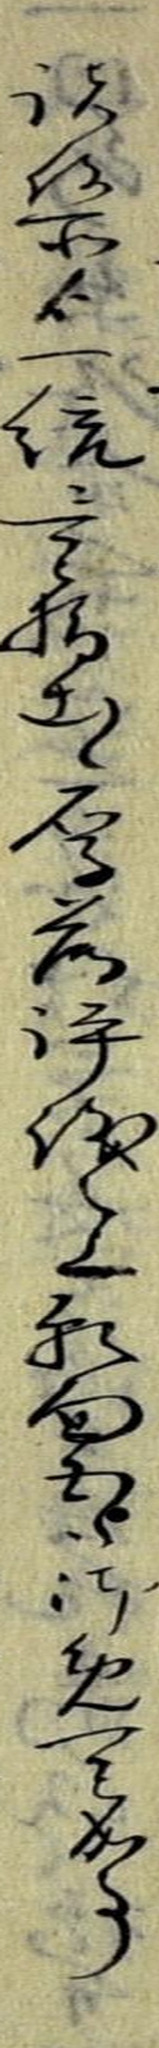諸役所ゟ一統に可被指出候厚薄評儀之上願面五つ御免可被成事
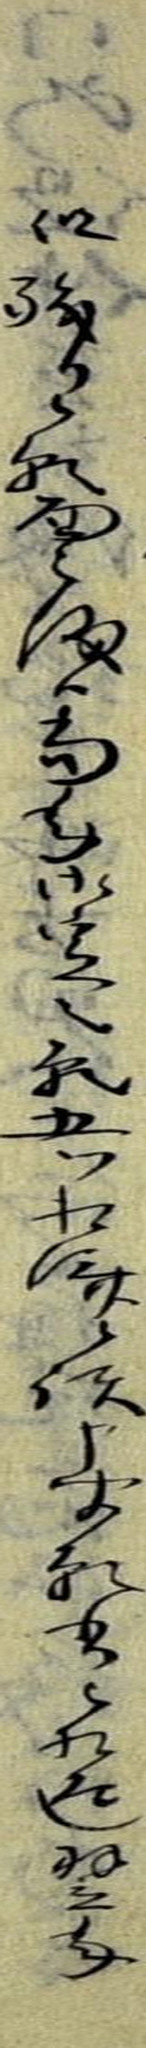但残り候願面之儀は当年御定之願五つ相済候訳申聞願書被相返翌年
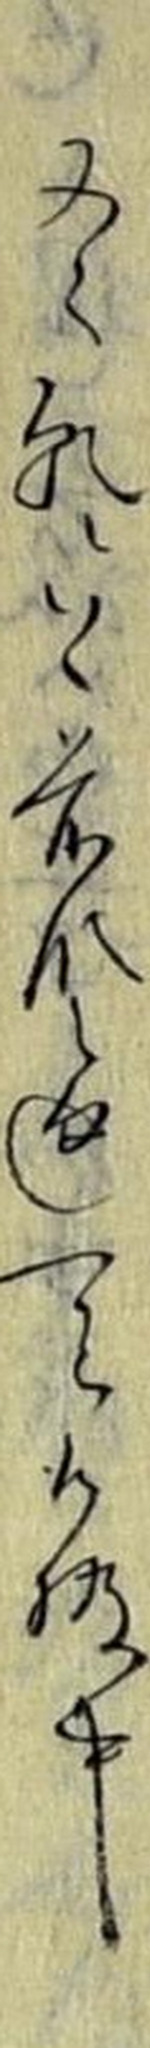又々願候はヽ前段之通可被取扱事
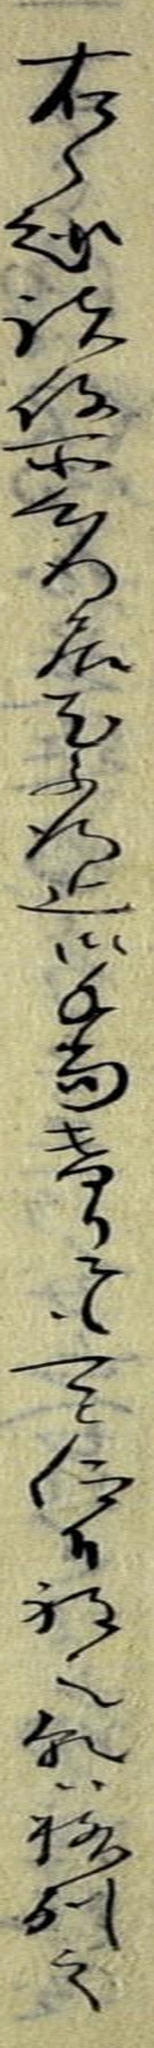右之趣諸役所心得居尤不得止御手当替りにも可被仰付程之願は格別之
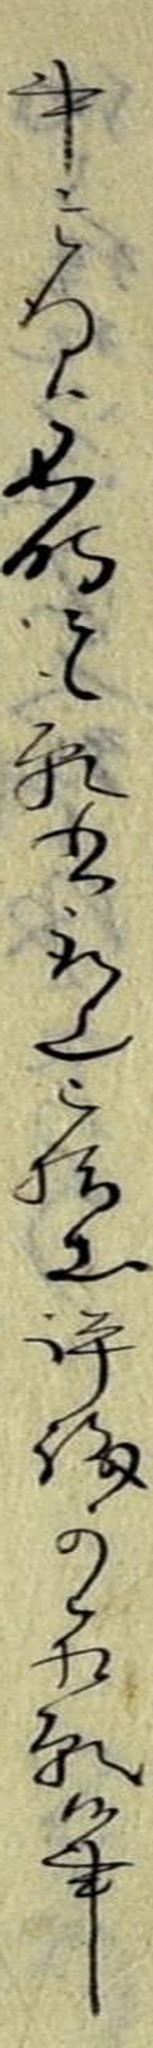事に候得は不時にも願書取上被指出評儀可被相願候事
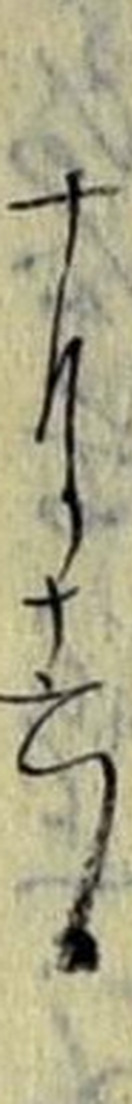十月十六日
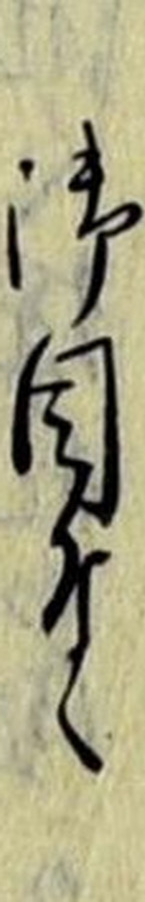御目付へ
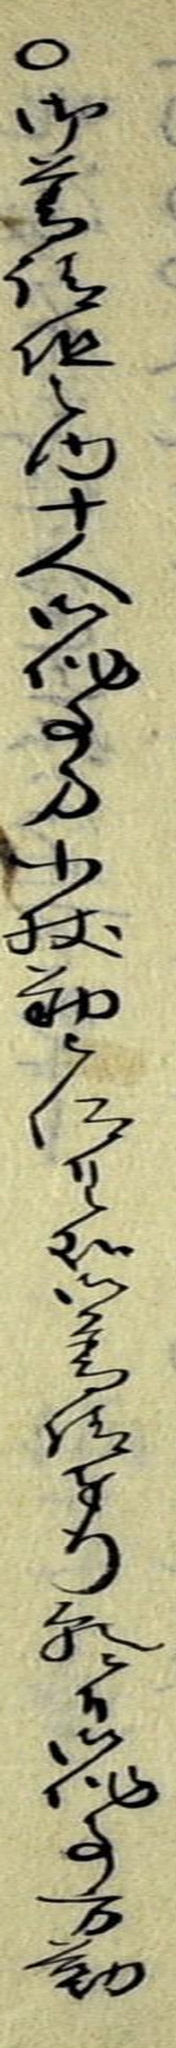○御普請組之内十人御作事方小杖勤被仰付候処御普請奉行願に付御作事方勤
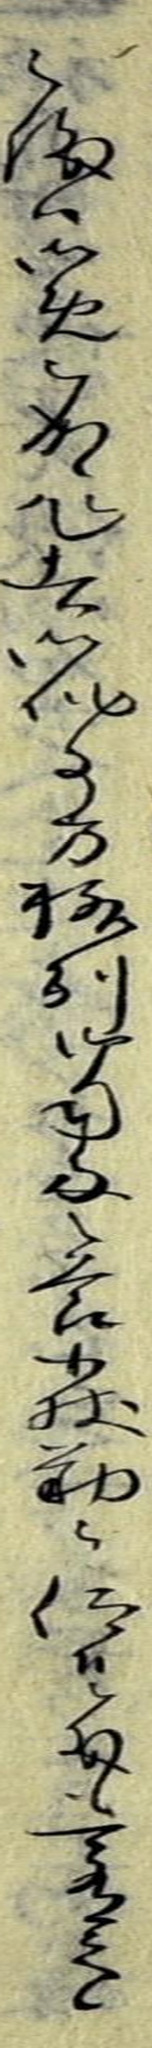之儀は御免被成候乍去御作事方格別御用多之節小技勤被仰付候義も可有之候
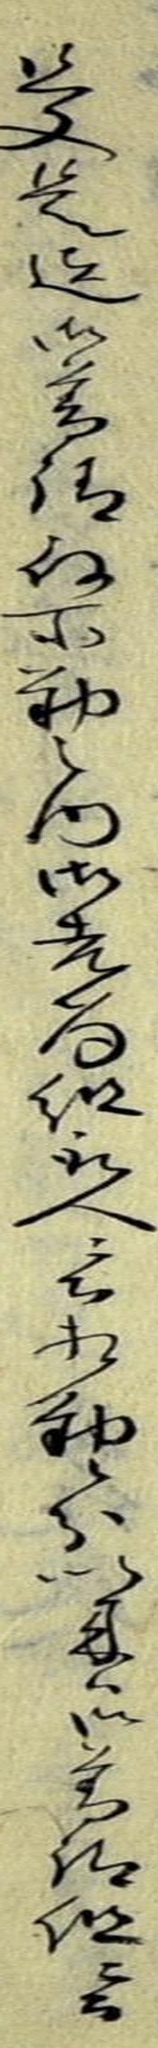且又是迄御普請役所勤之内御先筒組取人に而相勤候分以来は御普請組に而
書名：命令之部 四
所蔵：福井県文書館 Fukui Prefectural Archives
